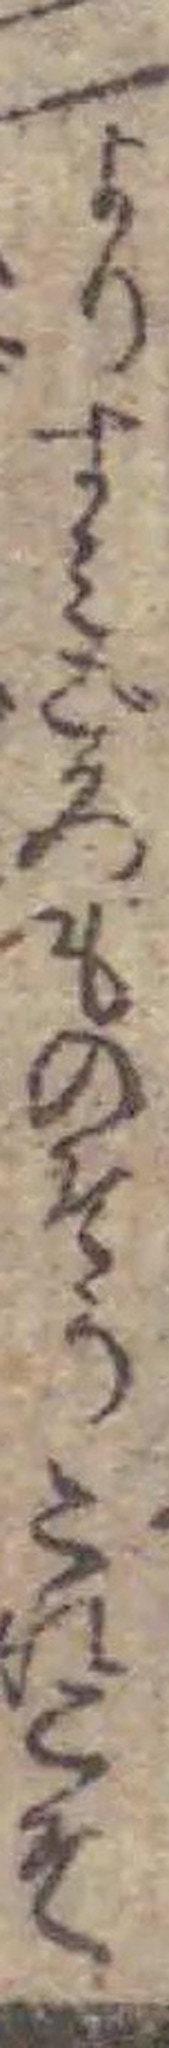よりすみごろものそうこれこそ
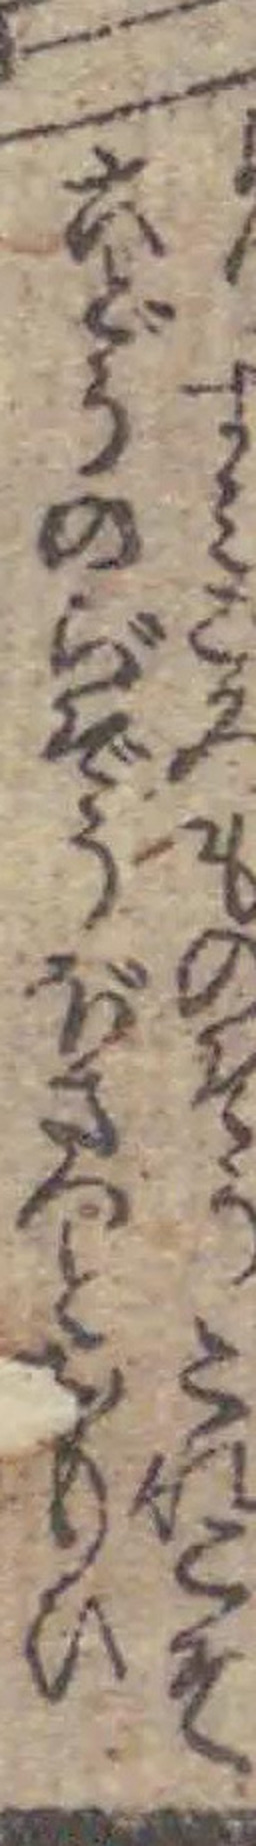六どうのぢぞうぼさつとおもひ
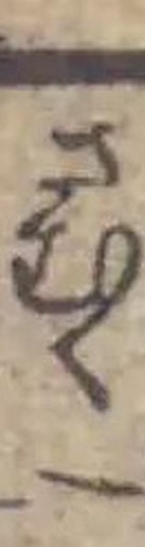さむく
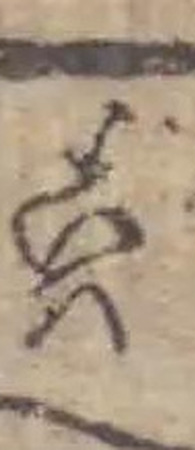よいは
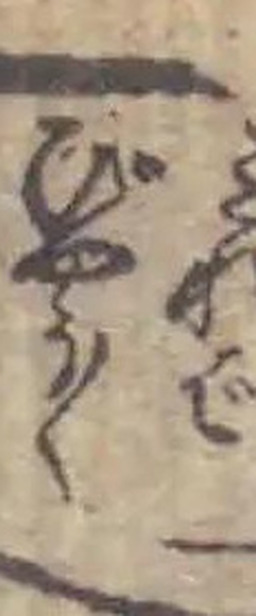びやう〳〵
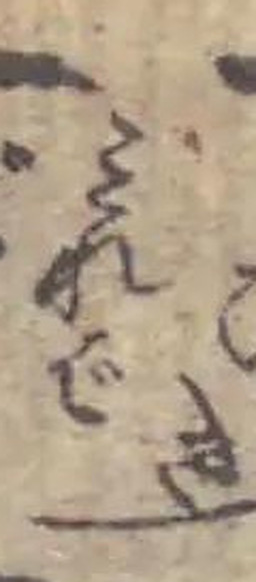これが
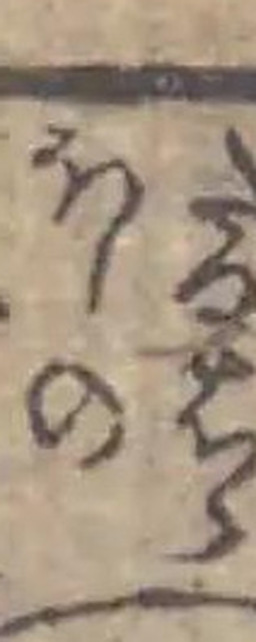ほしの
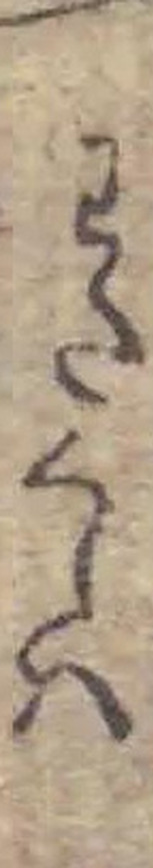わたくしは
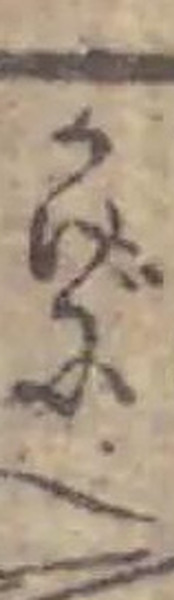かげに
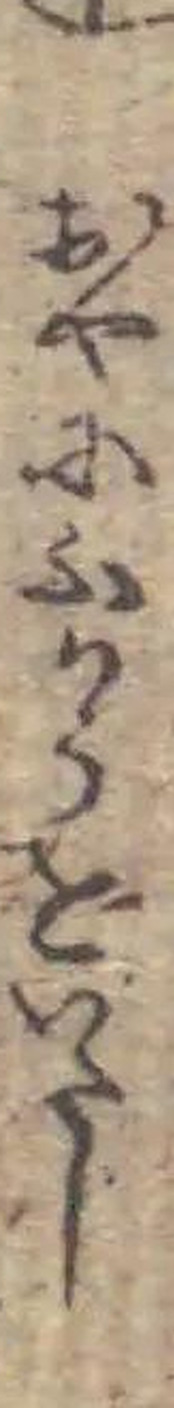おやにふかうをいたし
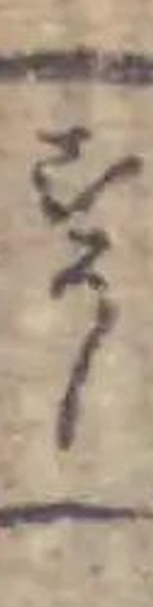すこし
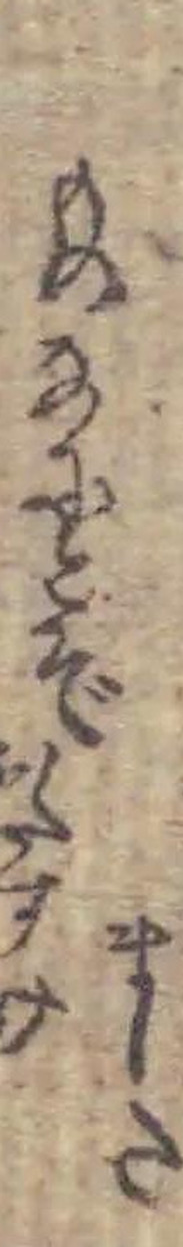ものなにとぞおたすけ
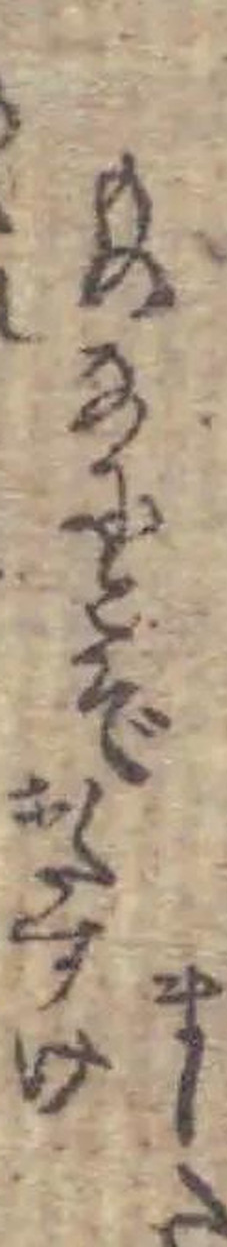ものなにとぞおたすけ
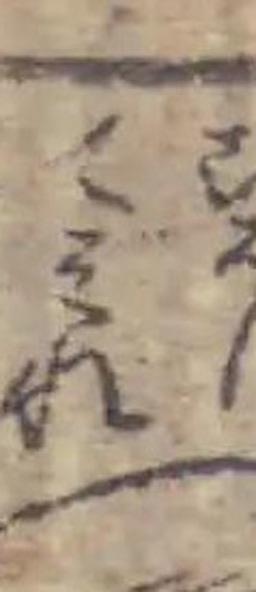てみれ
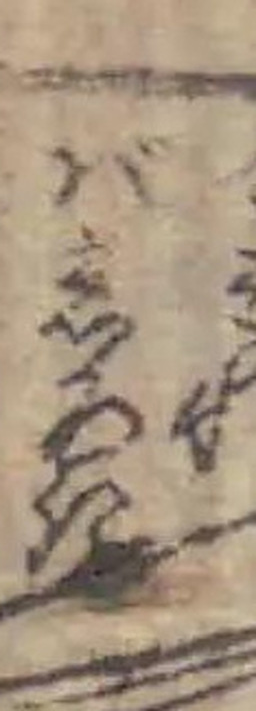ばしろき
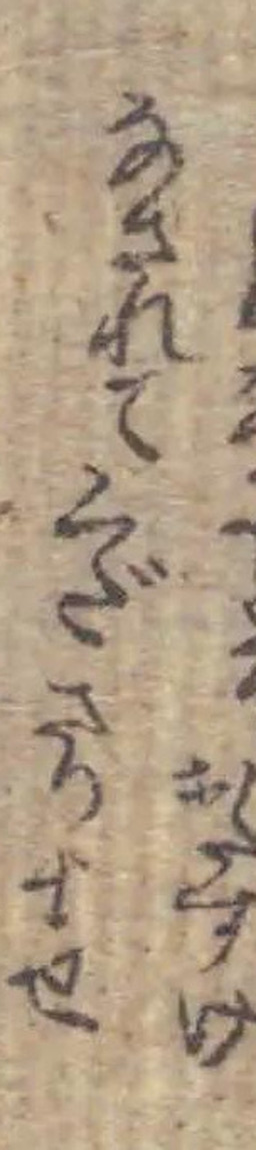なされてくださりませ
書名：飲中八人前 3巻
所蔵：国立国会図書館 National Diet Library, JAPAN
